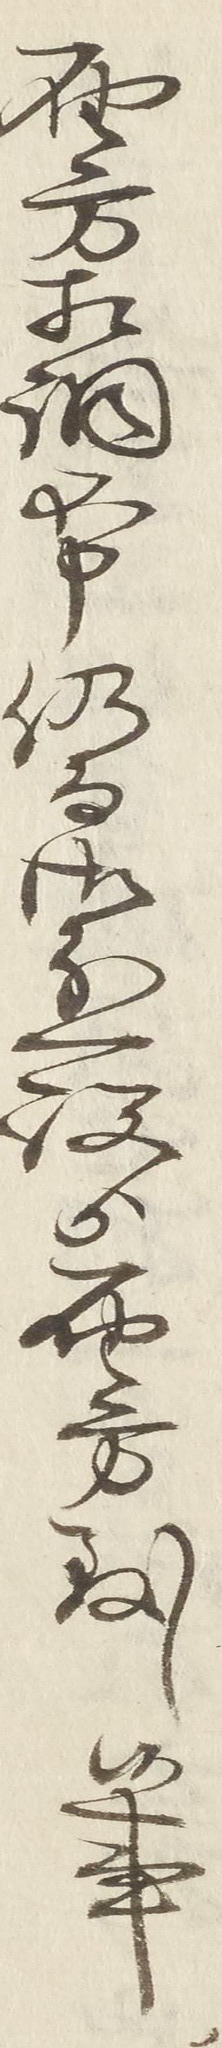届方相調不申仍而御分一役ゟ届方致し候事
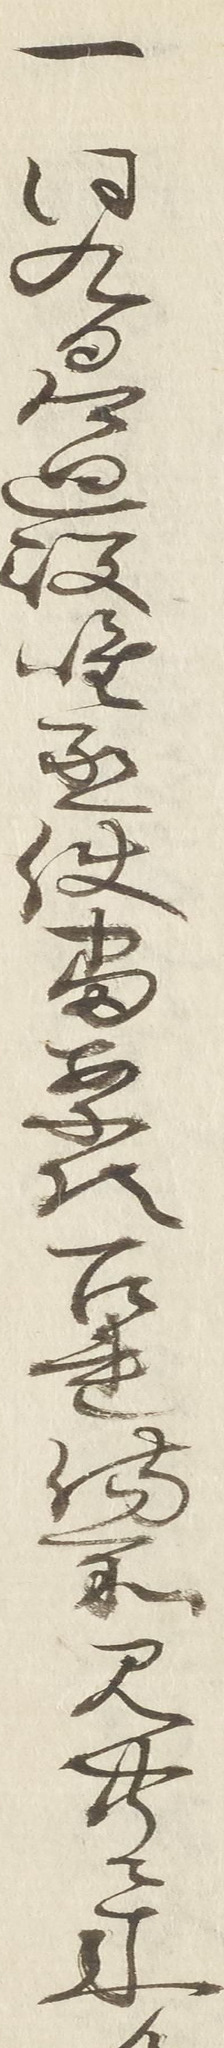一同九日郷廻役唯承使番案代召連傷所見聞に来ㇽ
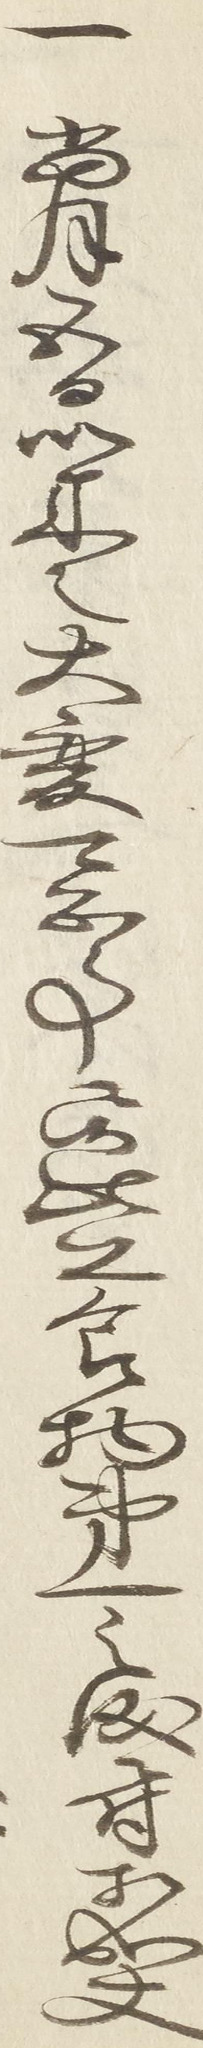一当月五日以来之大変可正事に候此上食物第一之儀二付相成丈
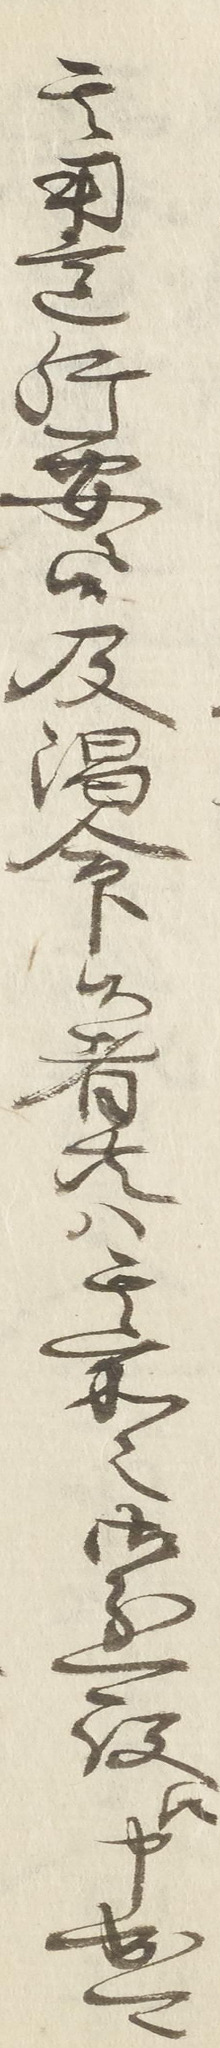其用意肝要二而及渇命候者共は其所之御分一役江申出可
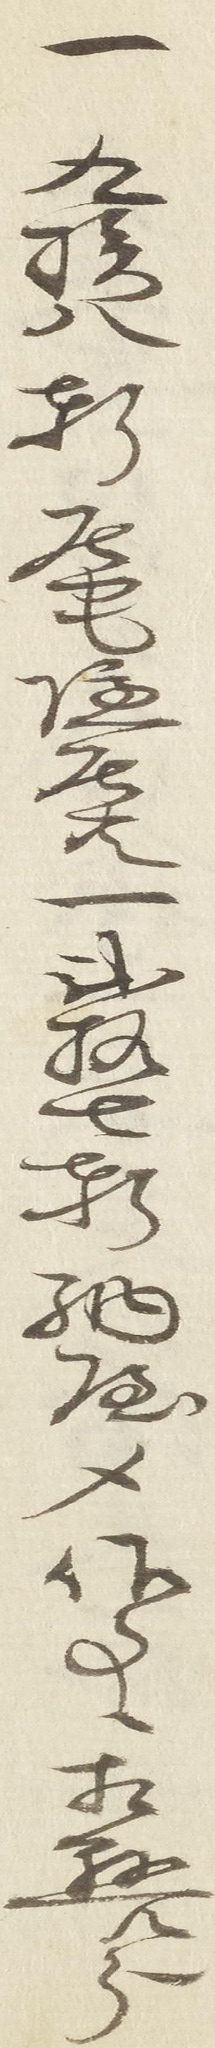一九拾八軒居宅隠居共一弐拾七軒納屋〆作事へ相懸候分
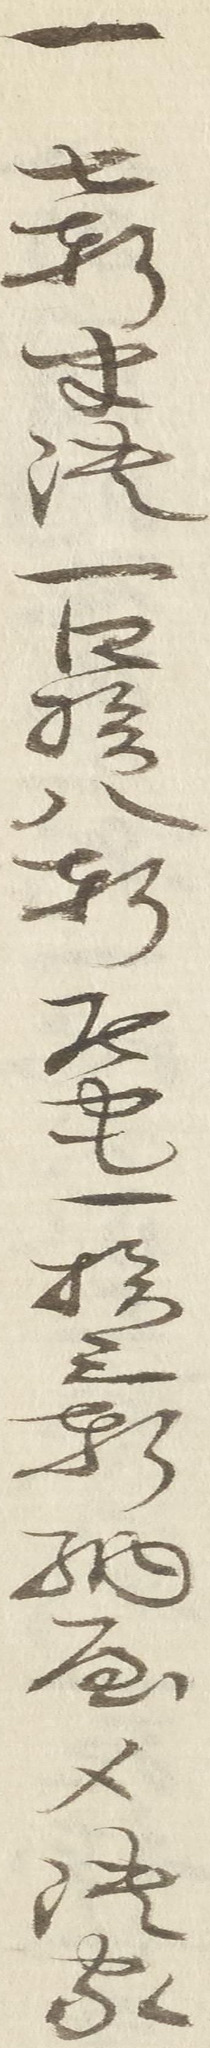一七軒半潰れ一四拾八軒居宅一拾三軒納屋〆潰家
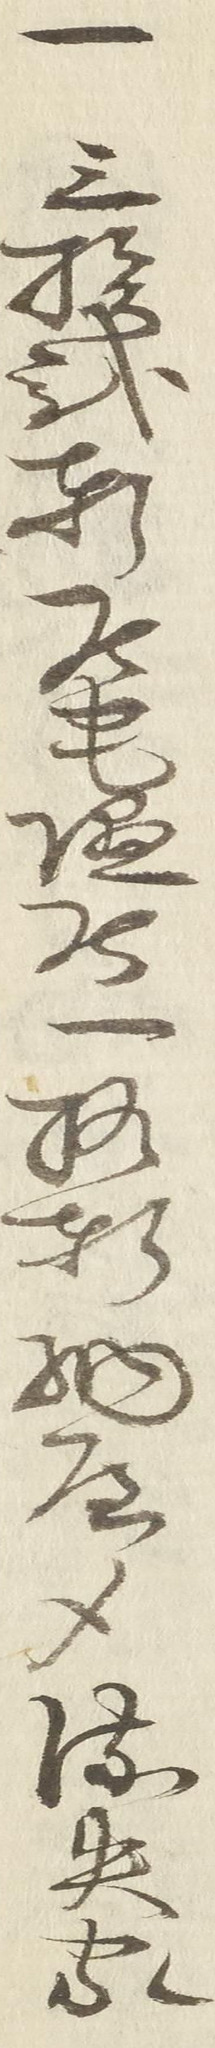一三拾弐軒居宅隠居一拾軒納屋〆流失家
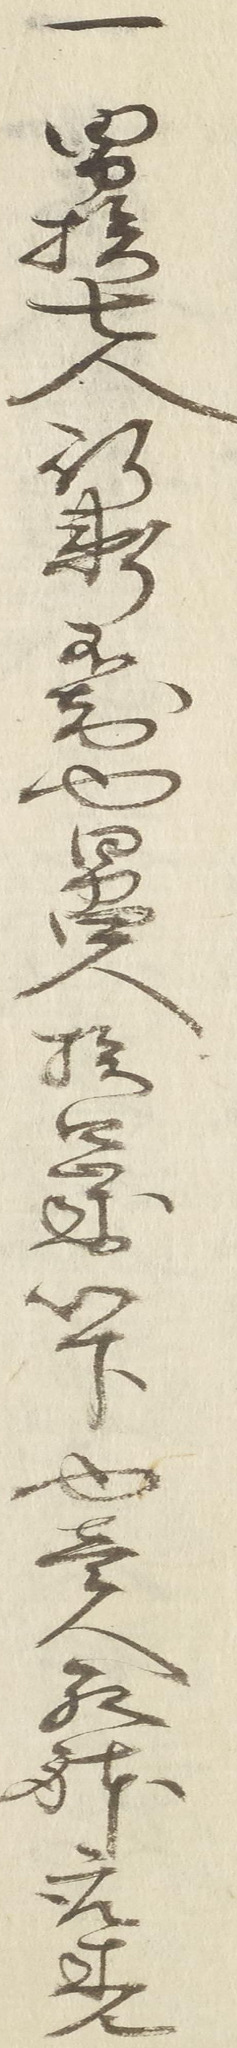一男拾七人行衛不知内男四人拾四歳以下内壱人死体取来ㇽ

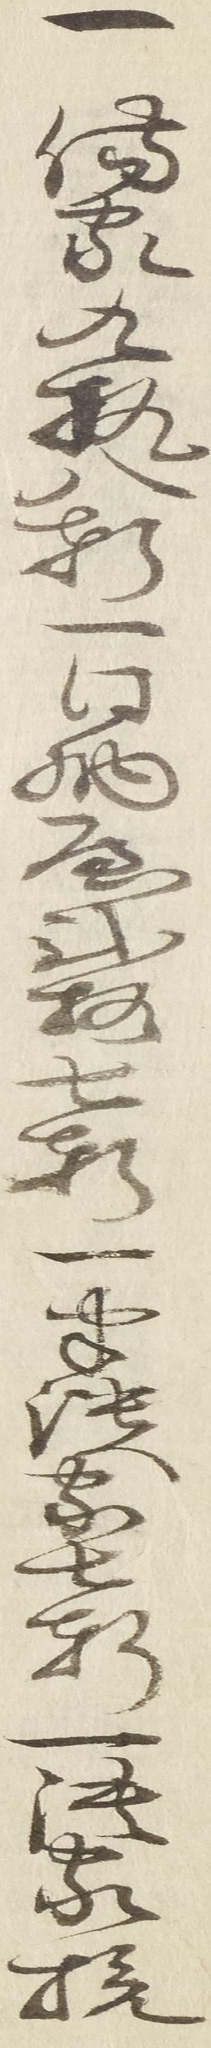一傷家九拾八軒一同物置弐拾七軒一半潰家七軒一潰家拾
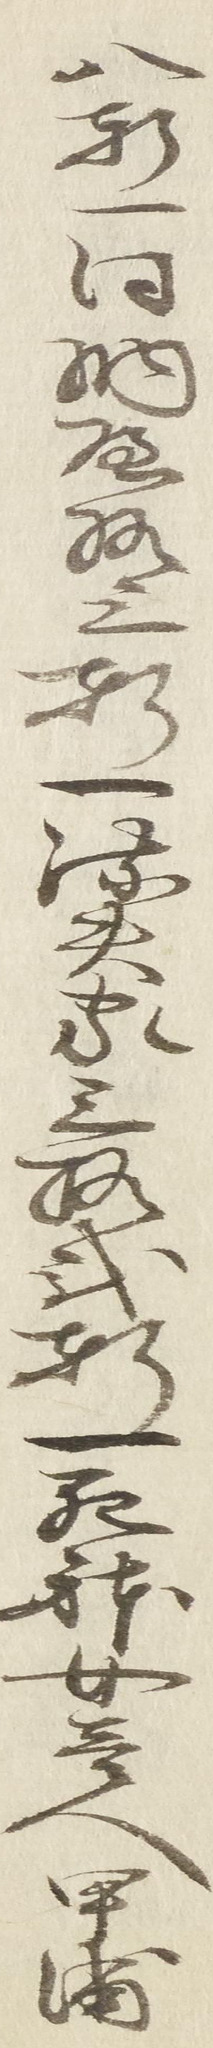八軒一同納屋拾三軒一流失家三拾弐軒一死体女壱人甲浦
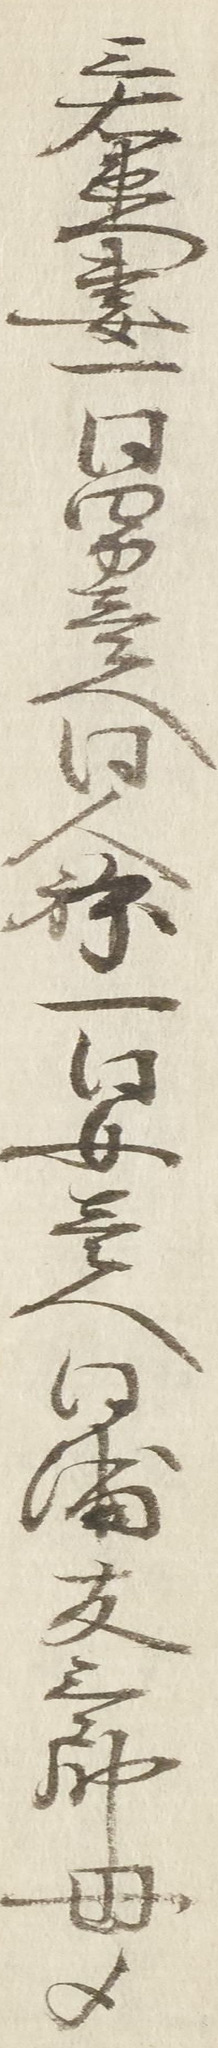三右衛門妻一同男壱人同人孫一同女壱人同浦友三郎母〆
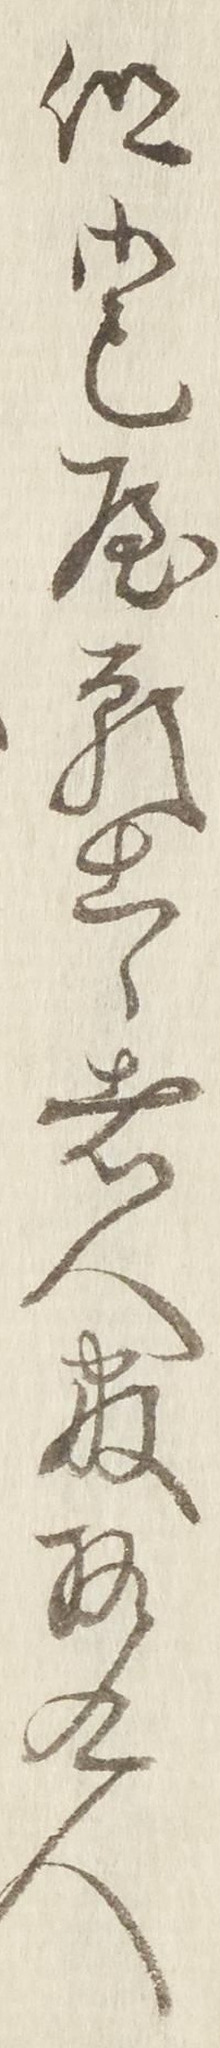但御已屋願出候者人数拾九人
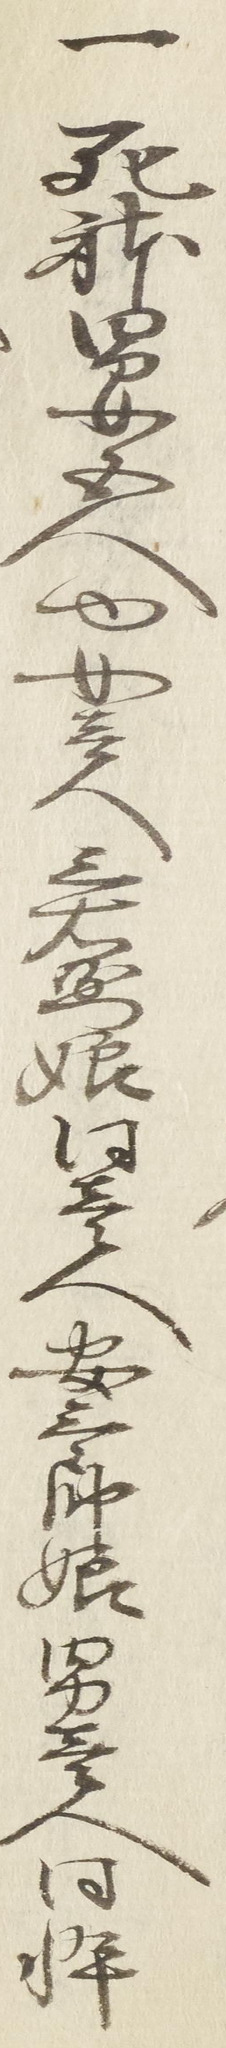一死体男女五人内女壱人三右衛門娘同壱人安三郎娘男壱人同忰
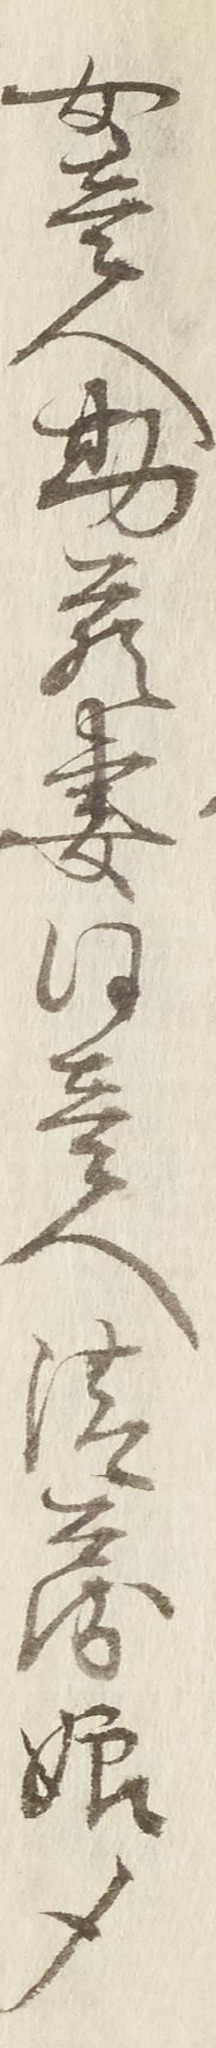女壱人勘蔵妻同壱人清兵衛娘〆
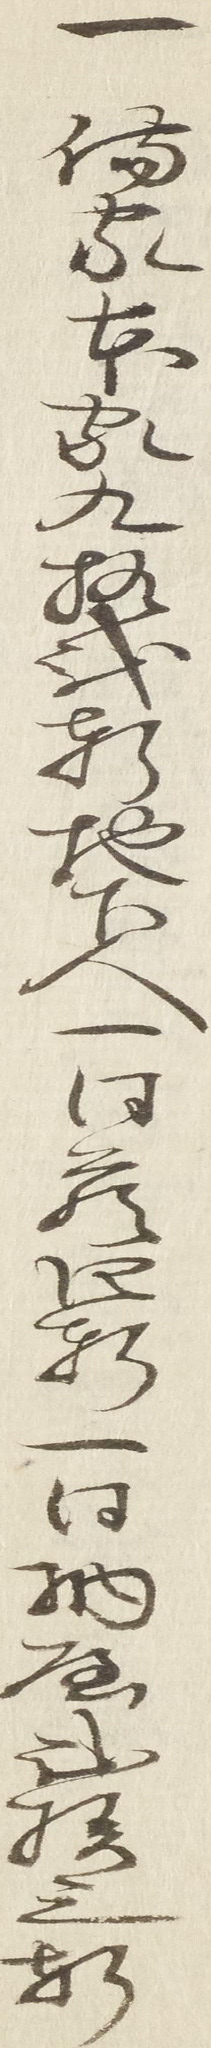一傷家本家九拾弐軒地下人一同蔵四軒一同納屋弐拾三軒
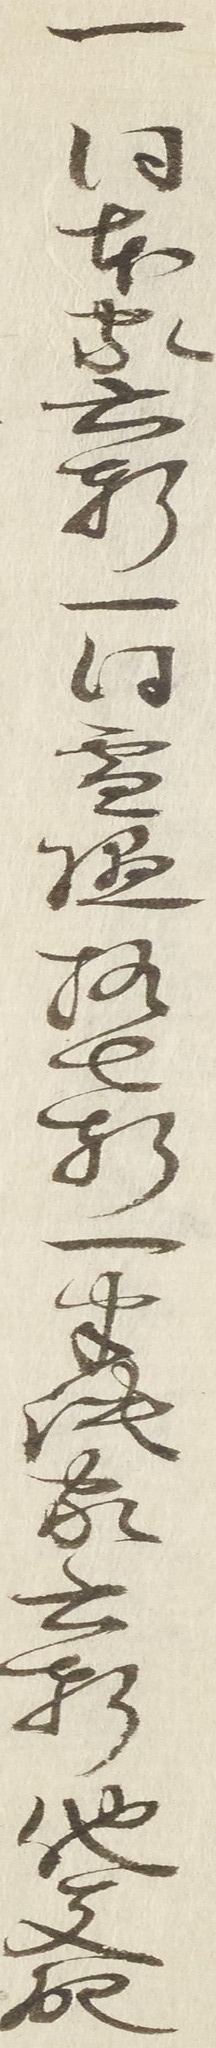一同本家六軒一同雪隠拾七軒一半潰家六軒外支配
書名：地震記　下
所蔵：東京大学地震研究所図書室 Earthquake Research Institute Library, The University of Tokyo, JAPAN
